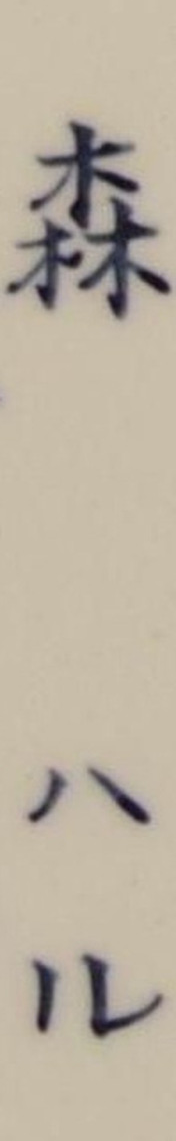森ハル
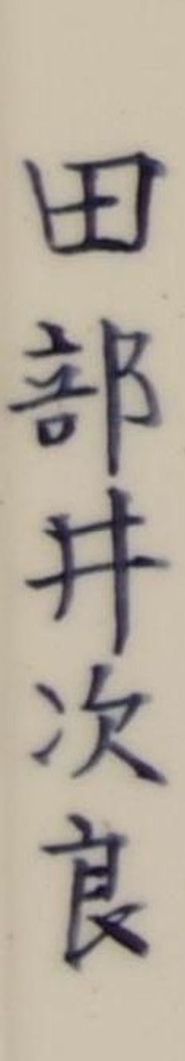田部井次良

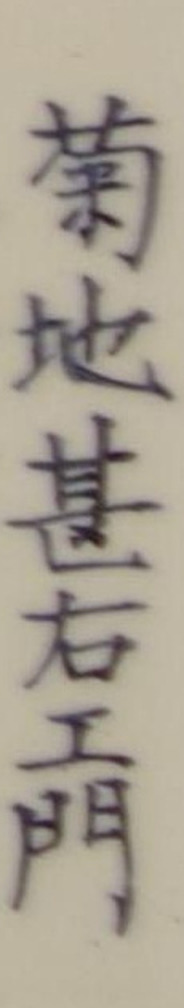菊地甚右エ門
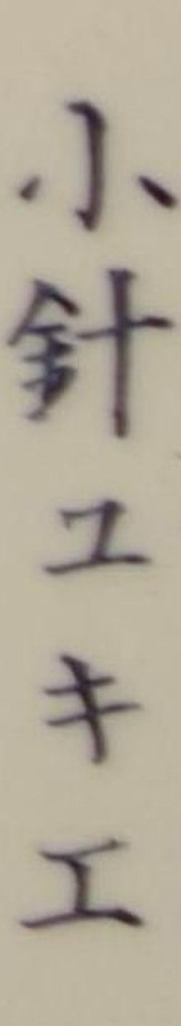小針ユキ工
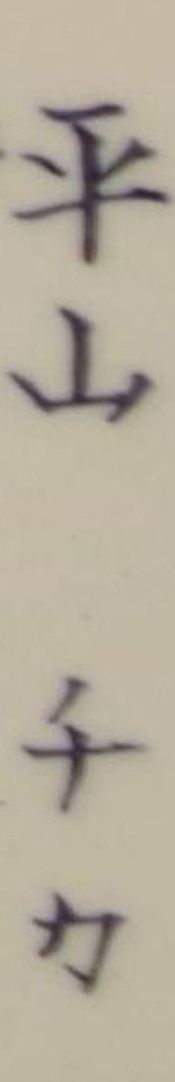平山チカ
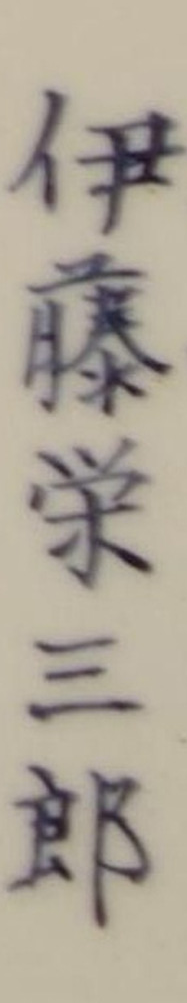伊藤栄三郎
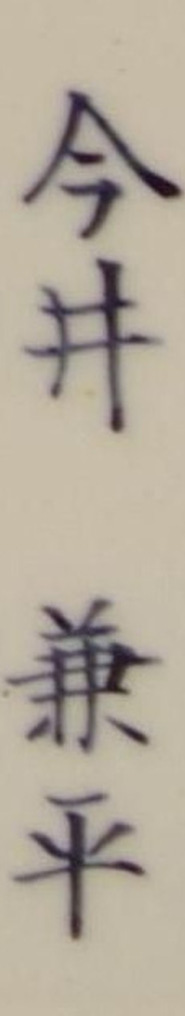今井兼平
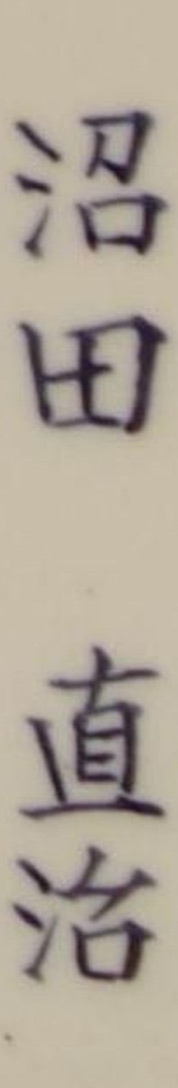沼田直治
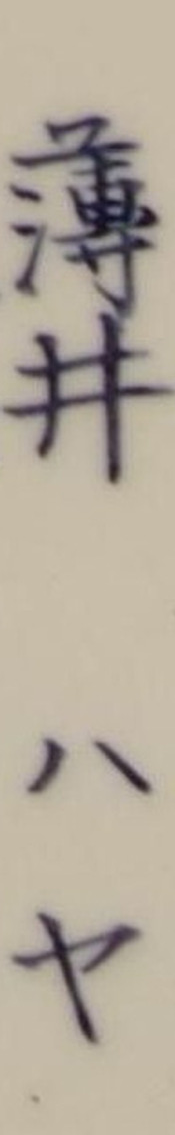薄井ハヤ
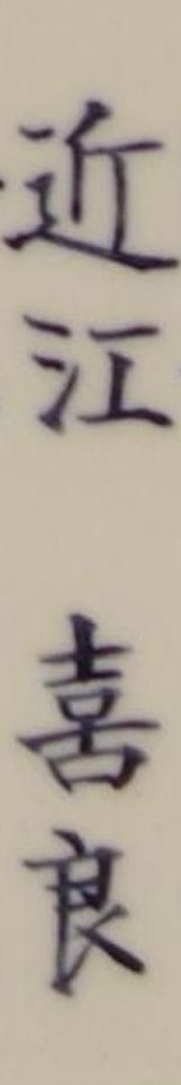近江喜良
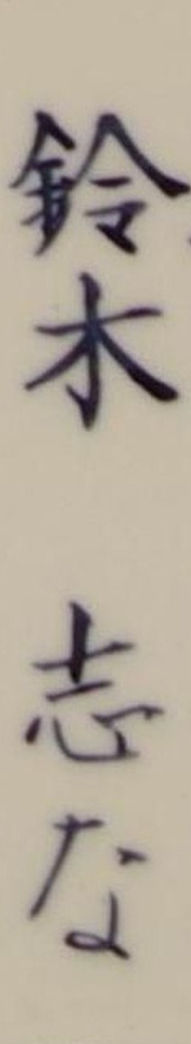鈴木志な
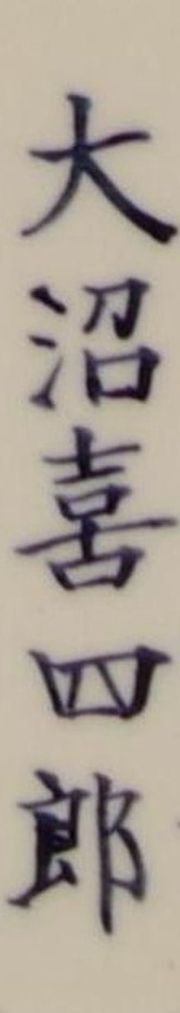大沼喜四郎
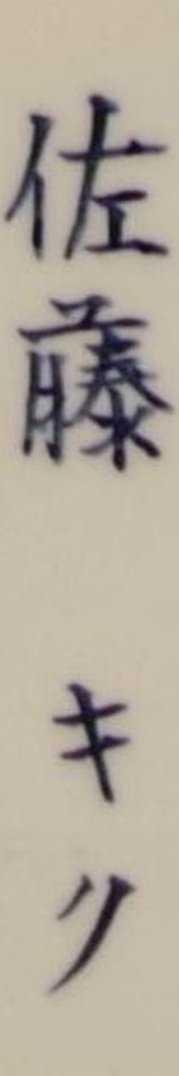佐藤キク
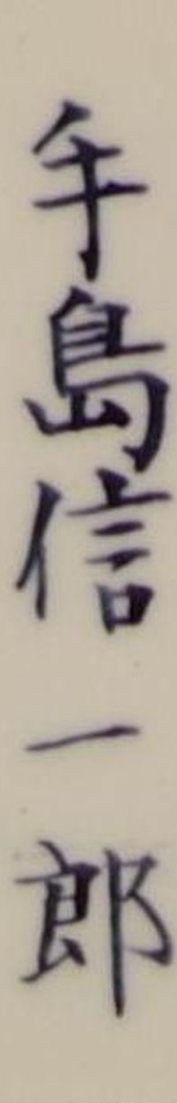手島信一郎
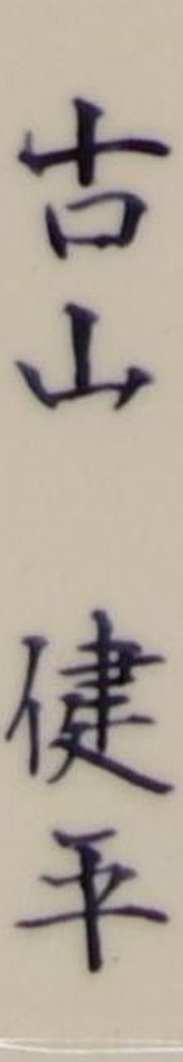古山健平
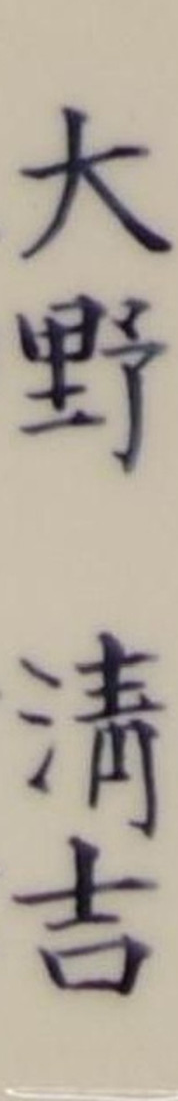大野清吉
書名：E~L
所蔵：高野山金剛峯寺
